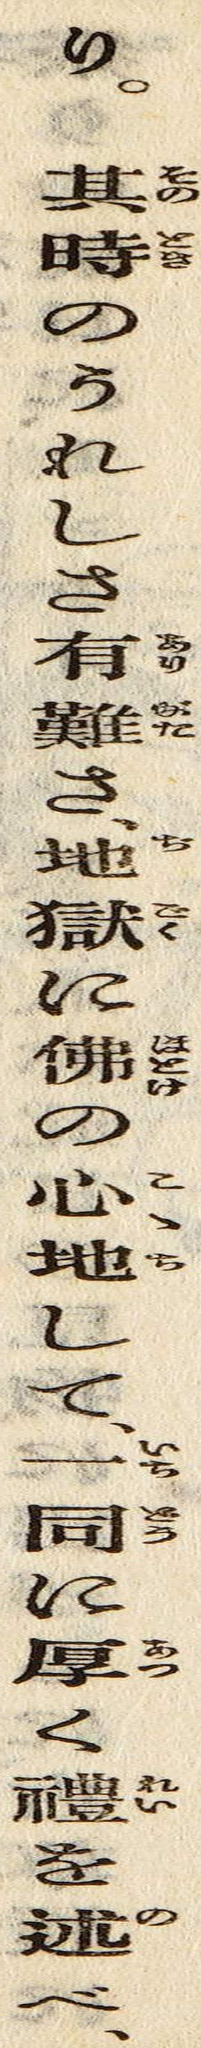り。其時のうれしさ有難さ、地獄に仏の心地して、一同に厚く礼を述べ、
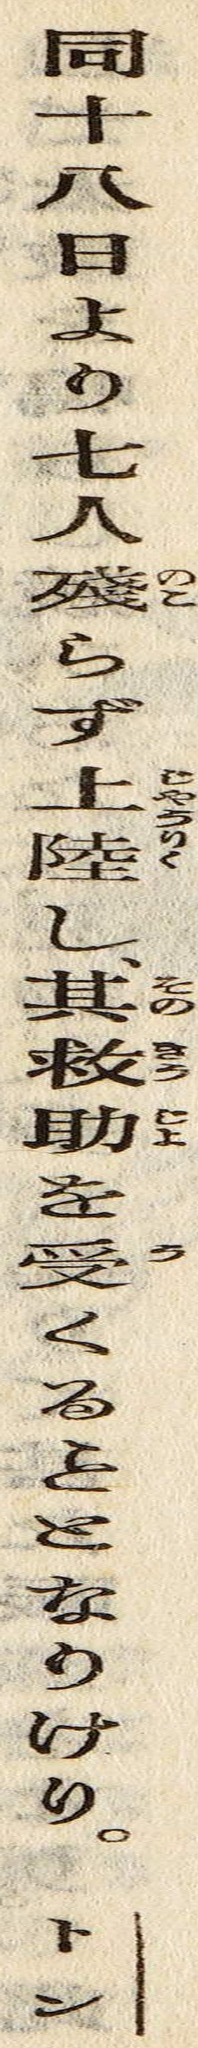同十八日より七人残らず上陸し、其救助を受くることとなりけり。トン
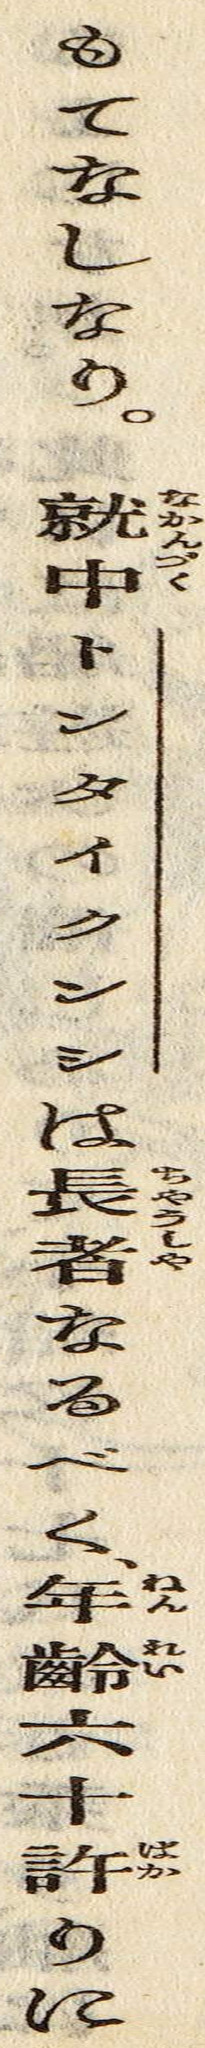もてなしなり。就中トンタイクンシは長者なるべく、年齢六十許りに
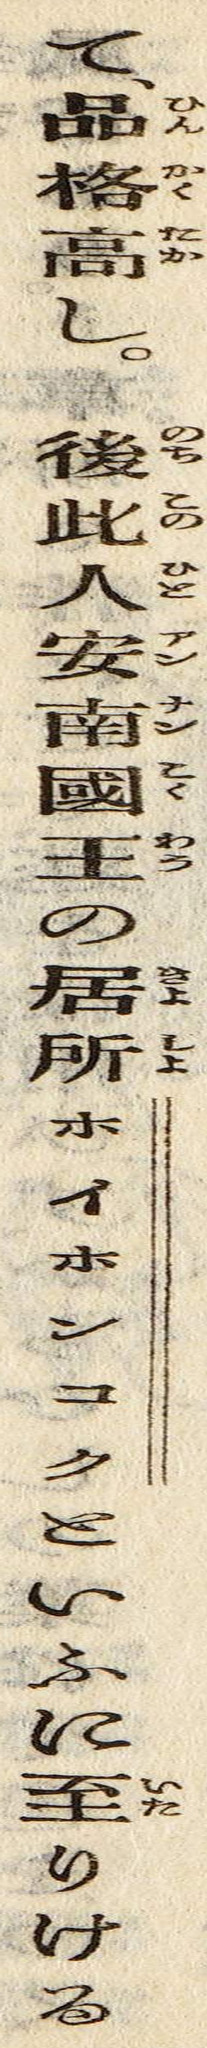て、品格高し。後此人安南国王の居所ホイホンコクといふに至りける
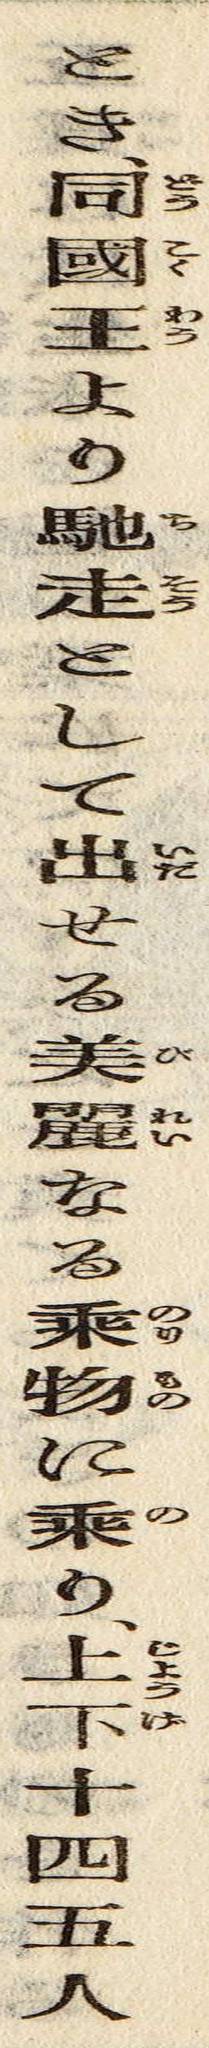とき、同国王より馳走として出せる美麗なる乗物に乗り、上下十四五人
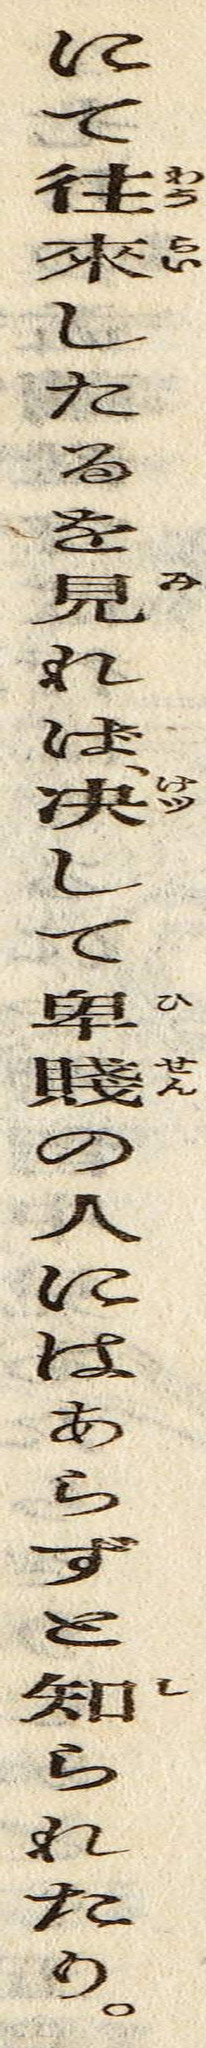にて往来したるを見れば、決して卑賎の人にはあらずと知られたり。
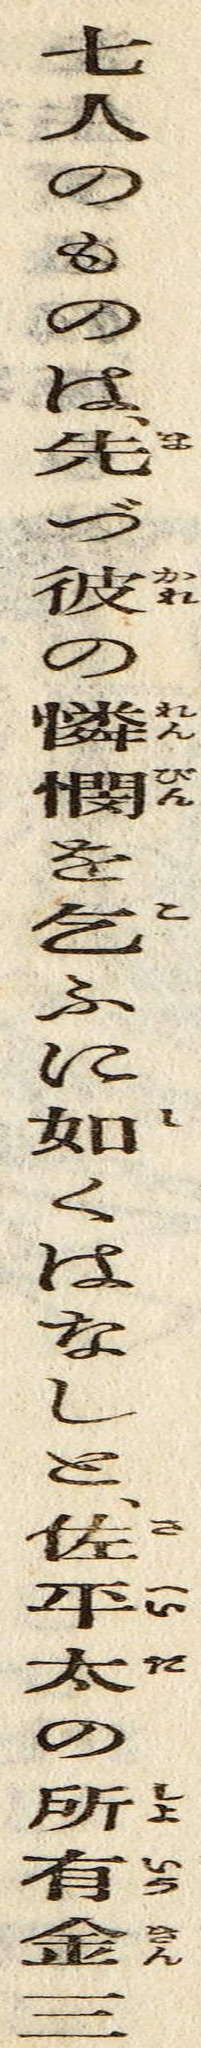七人のものは、先づ彼の憐憫を乞ふに如くはなしと、佐平太の所有金三
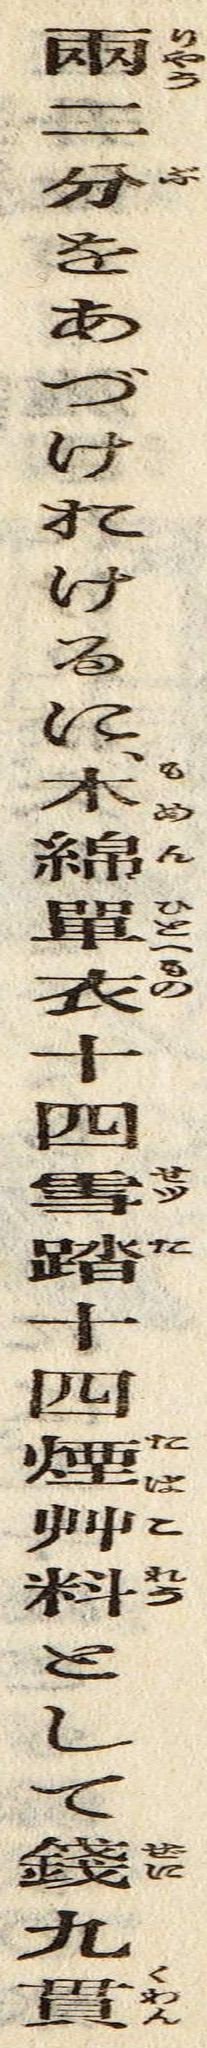両二分をあづけおけるに、木綿単衣十四雪踏十四煙艸料として銭九貫
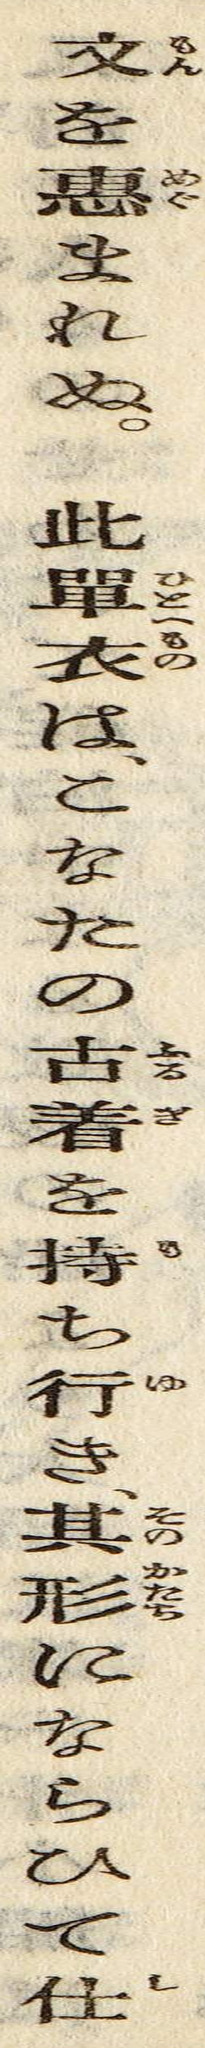文を恵まれぬ。此単衣は、こなたの古着を持ち行き、其形にならひて仕

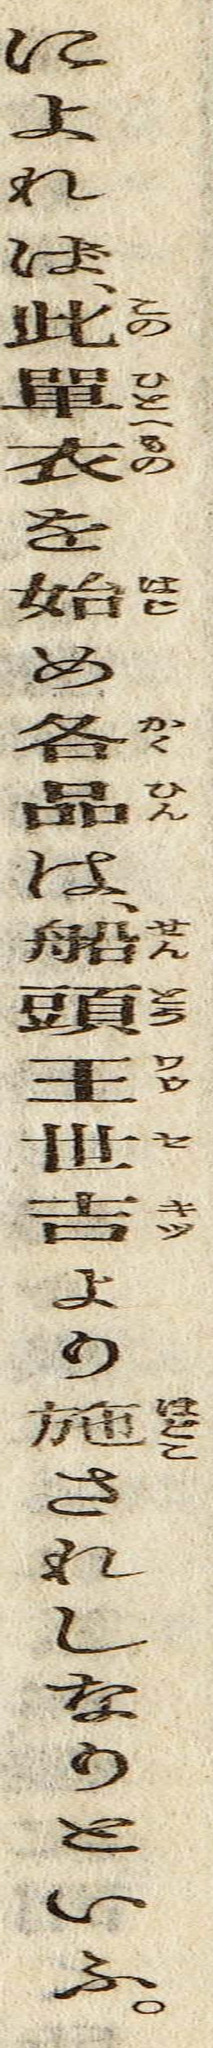によれば、此単衣を始め各品は、船頭王世吉より施されしなりといふ。
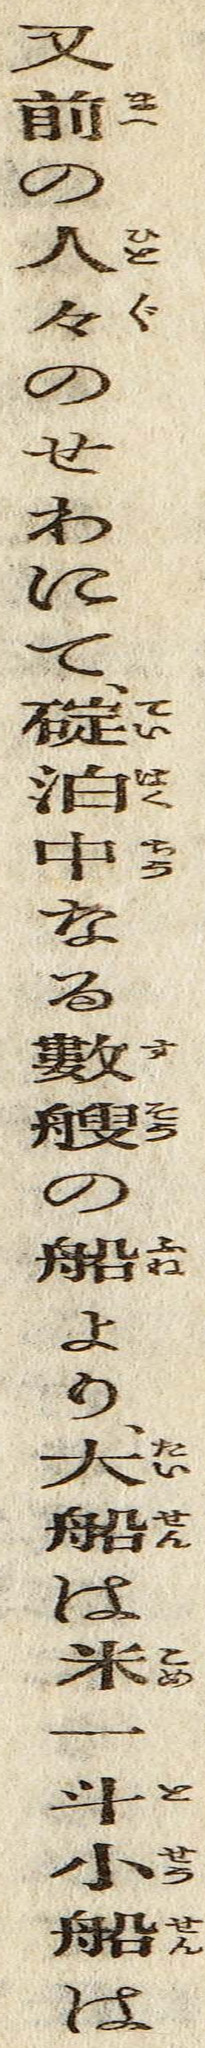又前の人々のせわにて、碇泊中なる数艘の船より、大船は米一斗小船は
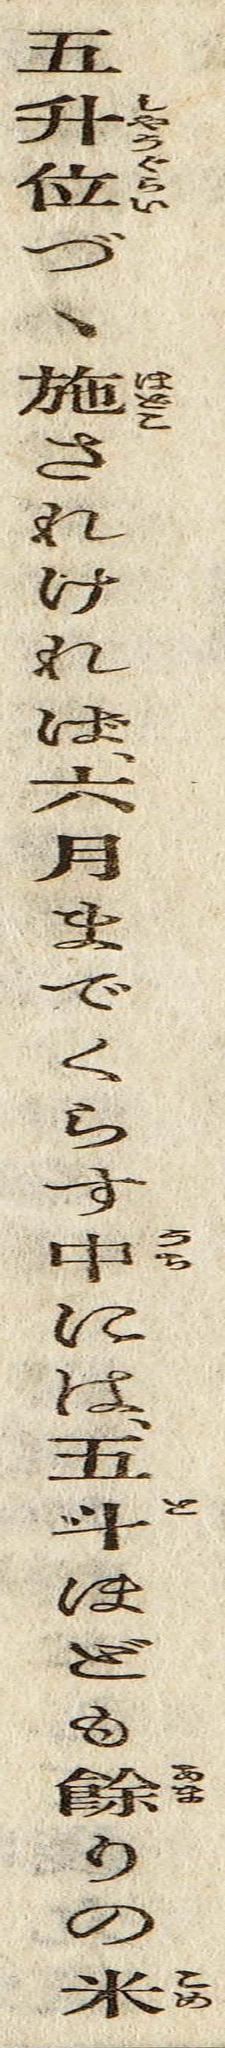五升位づヽ施されければ、六月までくらす中には、五斗ほども余りの米
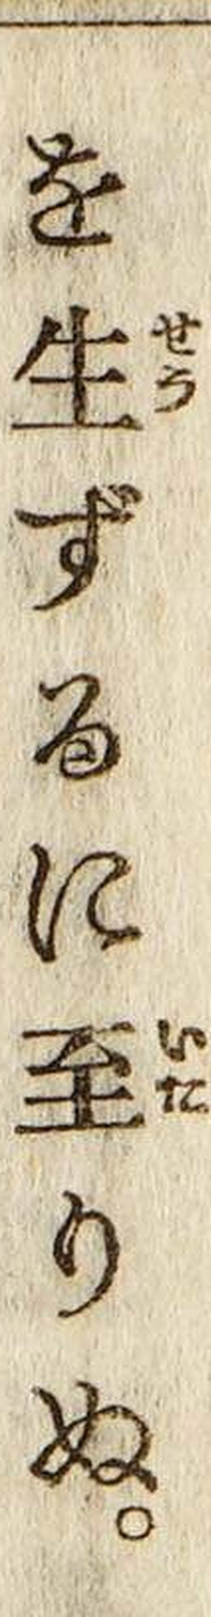を生ずるに至りぬ。
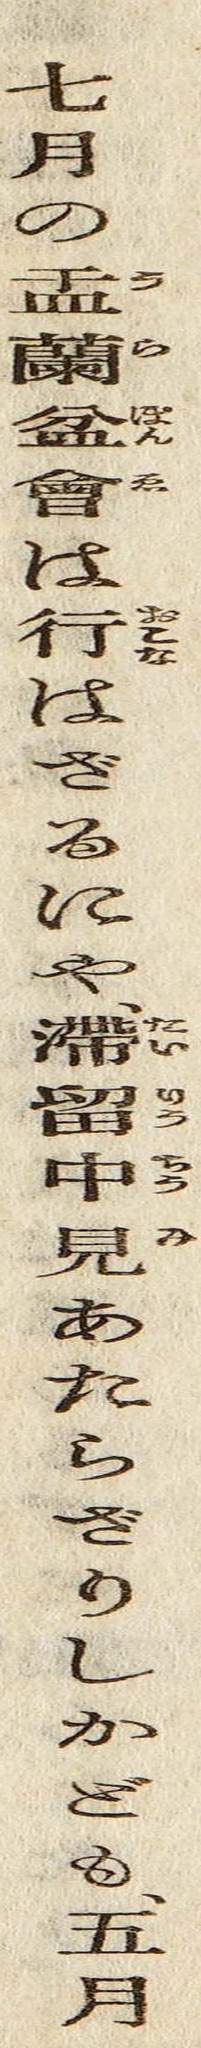七月の盂蘭盆会は行はざるにや、滞留中見あたらざりしかども、五月
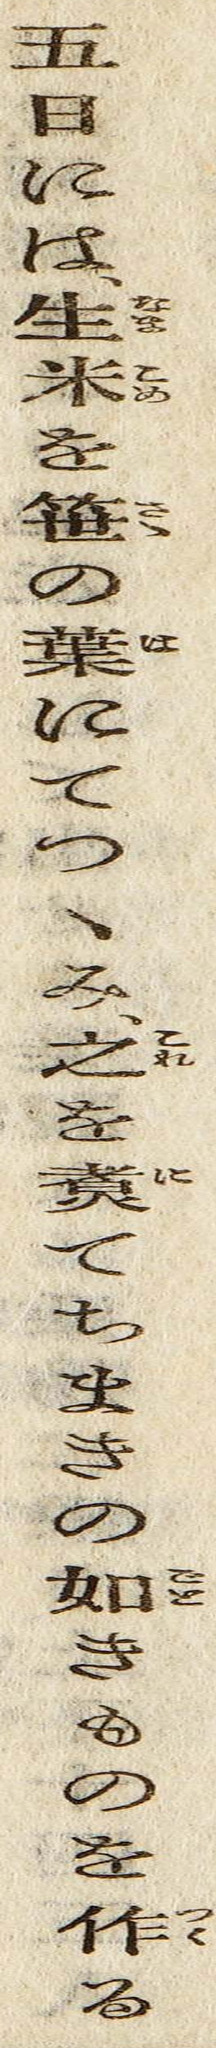五日には、生米を笹の葉にてつヽみ、之を煮てちまきの如きものを作る
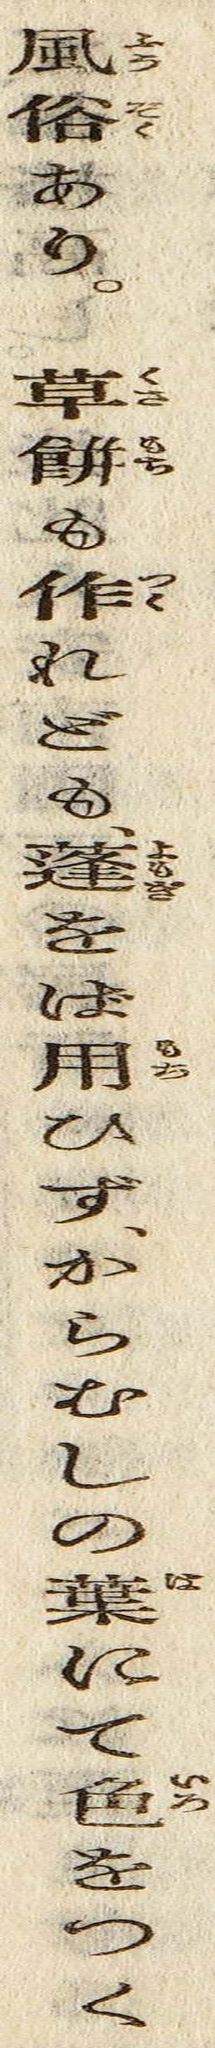風俗あり。草餅も作れども、蓬をば用ひず、からむしの葉にて色をつく
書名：日本漂流譚
